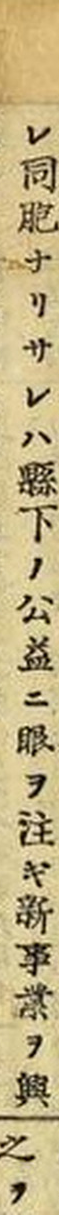レ同胞ナリサレハ縣下ノ公益ニ眼ヲ注ギ新事業ヲ興
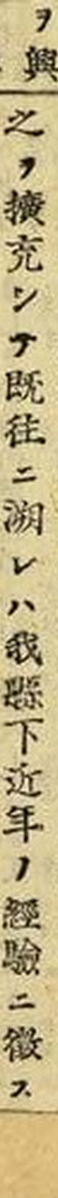之ヲ擴充シテ既往ニ溯レハ我縣下近年ノ經驗ニ徴ス
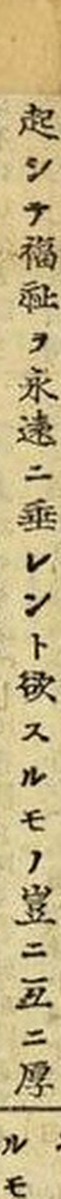起シテ福祉ヲ永遠ニ垂レント欲スルモノ豈ニ互ニ厚
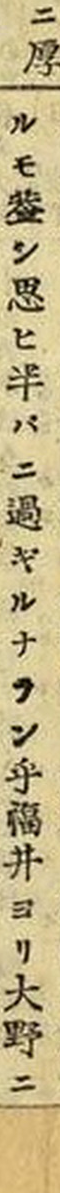ルモ蓋シ思ヒ半バニ過ギルナラン乎福井ヨリ大野ニ
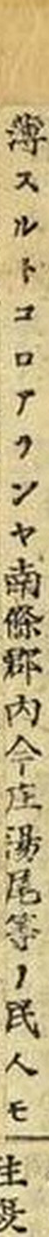薄スルトコロアランヤ南條郡内今庄湯尾等ノ民人モ
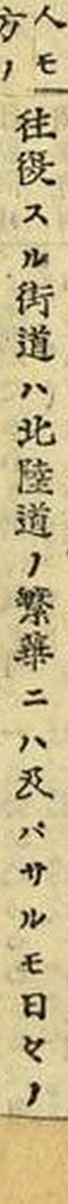往復スル街道ハ北陸道ノ繁華ニハ及バサルモ日々ノ
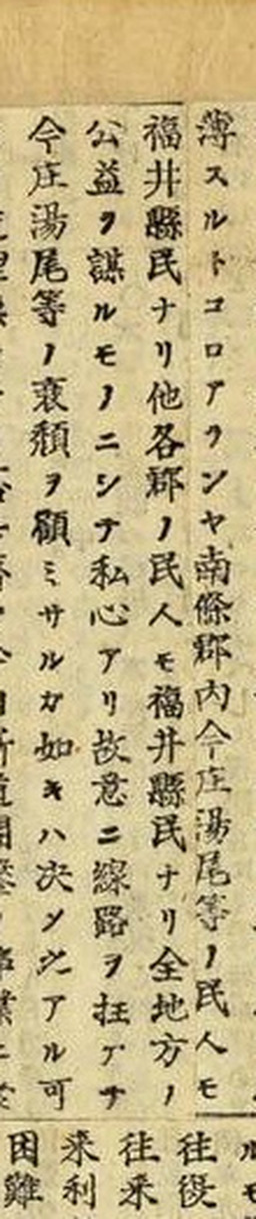公益ヲ謀ルモノニシテ私心アリ故意ニ線路ヲ枉ゲテ
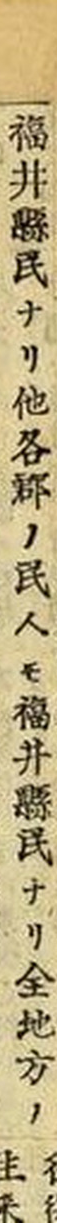福井縣民ナリ他各郡ノ民人モ福井縣民ナリ全地方ノ
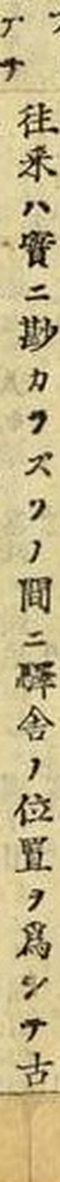往来ハ實ニ尠カラズソノ間ニ驛舎ノ位置ヲ爲シテ古
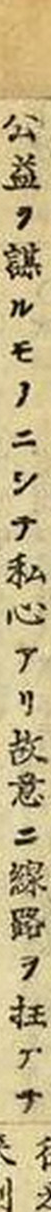公益ヲ謀ルモノニシテ私心アリ故意ニ線路ヲ枉ゲテ
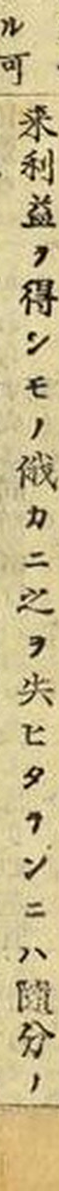来利益ヲ得シモノ俄カニ之ヲ失ヒタランニハ随分ノ
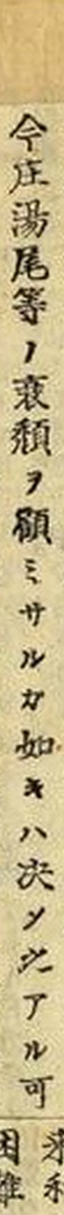今庄湯尾等ノ衰頽ヲ顧ミサルガ如キハ決シテ之アル可
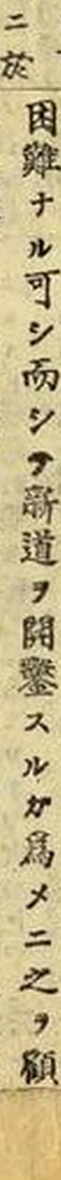困難ナル可シ而シテ新道ヲ開鑿スルガ爲メニ之ヲ顧
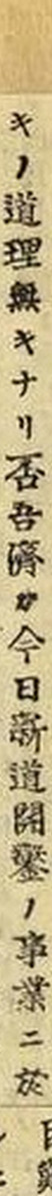キノ道理無キナリ否吾儕ガ今日新道開鑿ノ事業ニ於
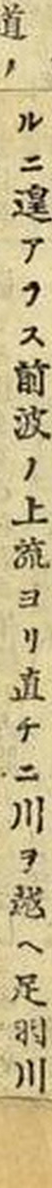ルニ遑アラス前波ノ上流ヨリ直チニ川ヲ越ヘ足羽川
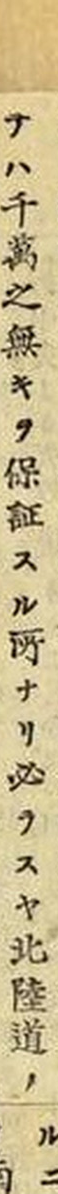テハ千萬ノ無キヲ保証スル所ナリ必ラスヤ北陸道ノ
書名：温古集 五巻
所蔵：福井県文書館 Fukui Prefectural Archives
